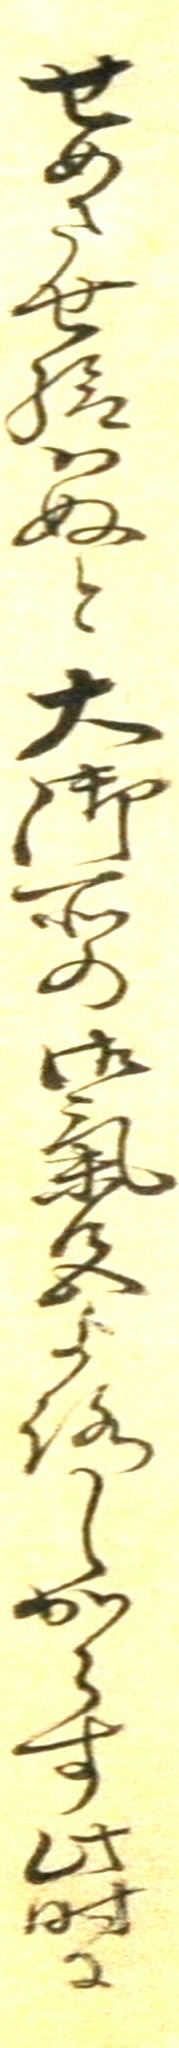せめさせ給はぬと大御所の御気色よろしからす此時に

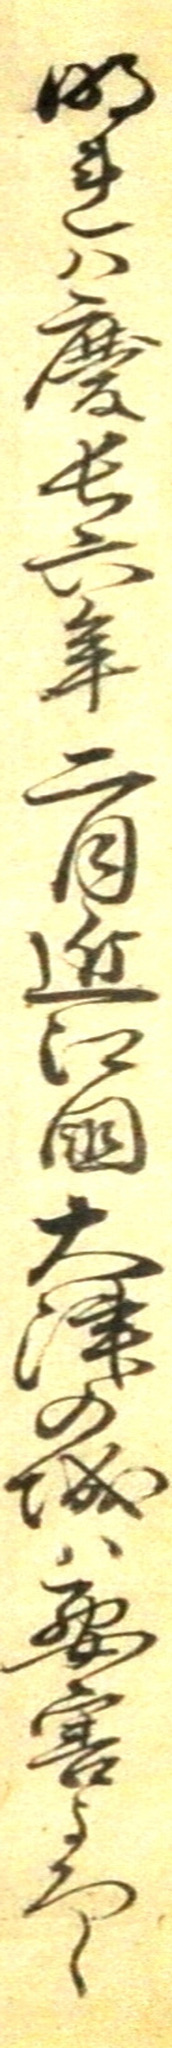明れは慶長六年二月近江国大津の城は要害よろし
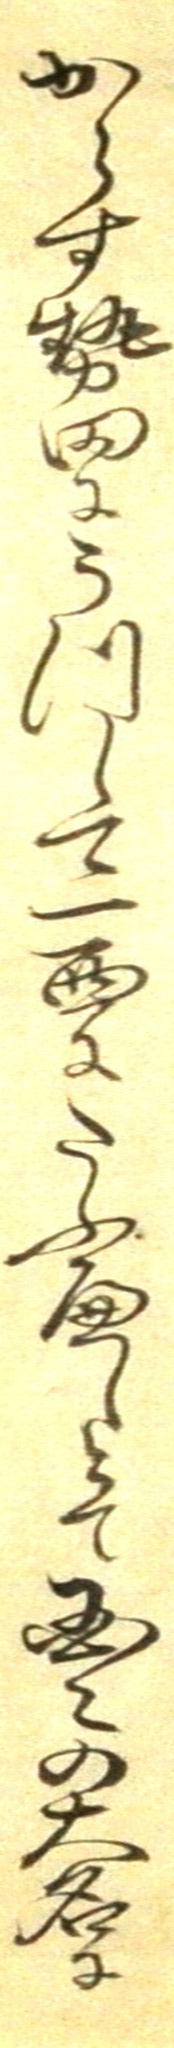からす勢田にうつして一西にたふへしとて国々の大名に
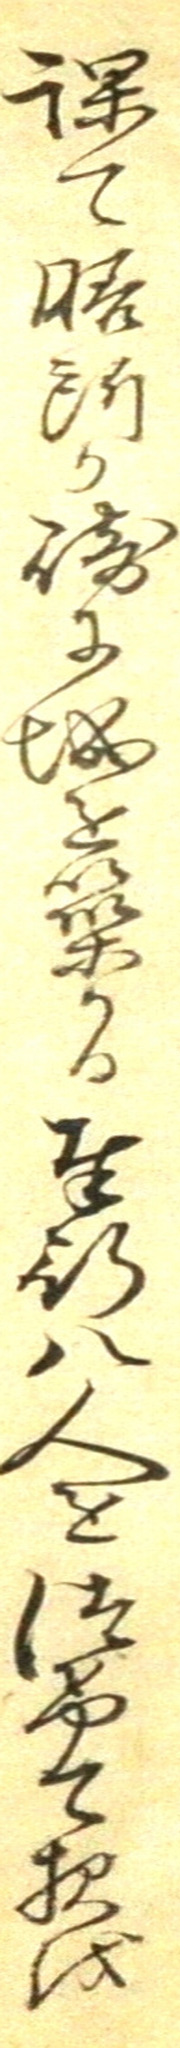課て膳所か崎に城を築かる奉行八人をつけて択を
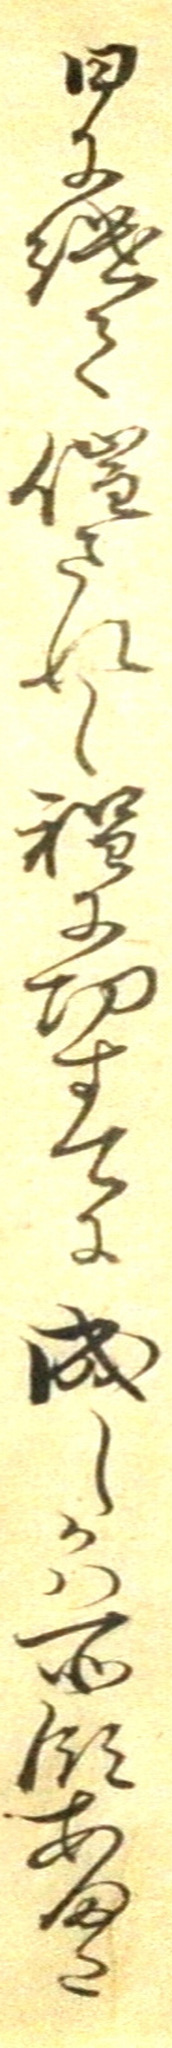日に継て催されし程に功すてに成しかは所領あまた
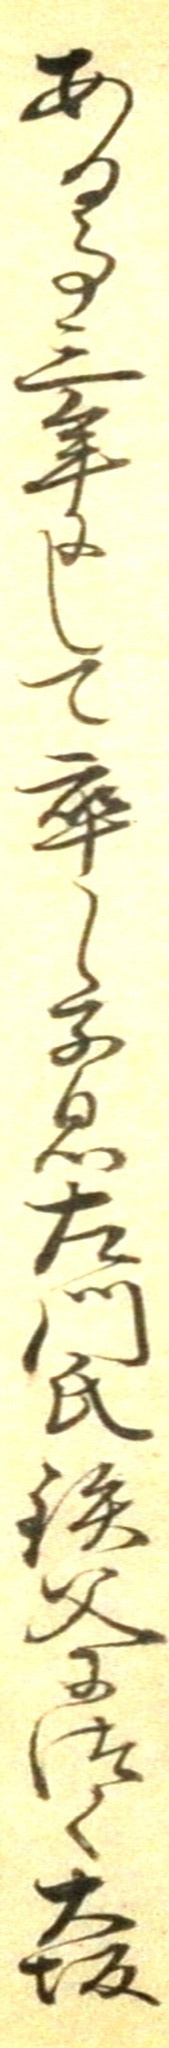ある事三年にして卒し子息左門氏鉄父につく大坂
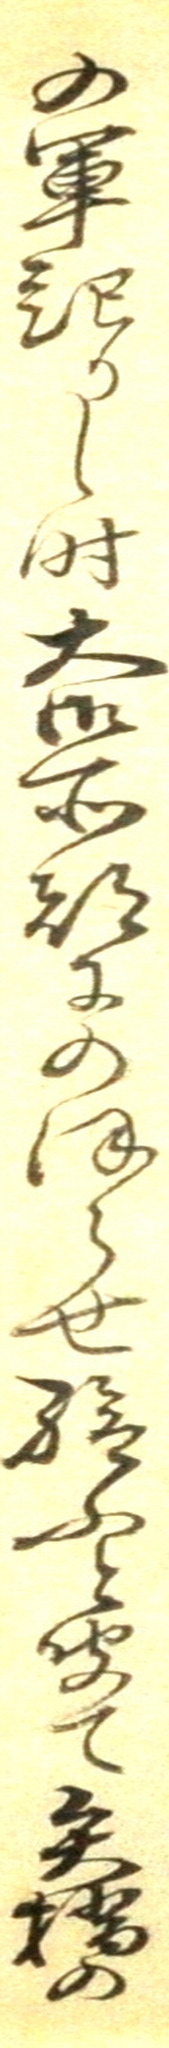の軍起りし時大御所都にのほらせ給ふと聞て矢橋の
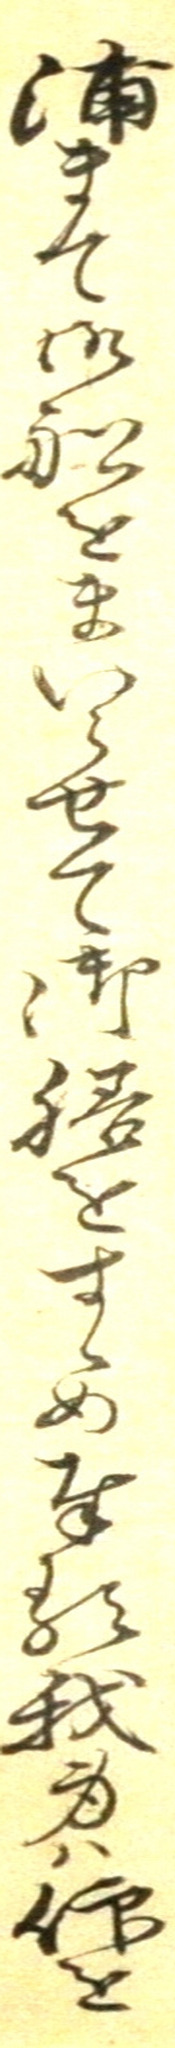浦まて御船をまいらせて御膳をすゝめ奉る我身は仰を
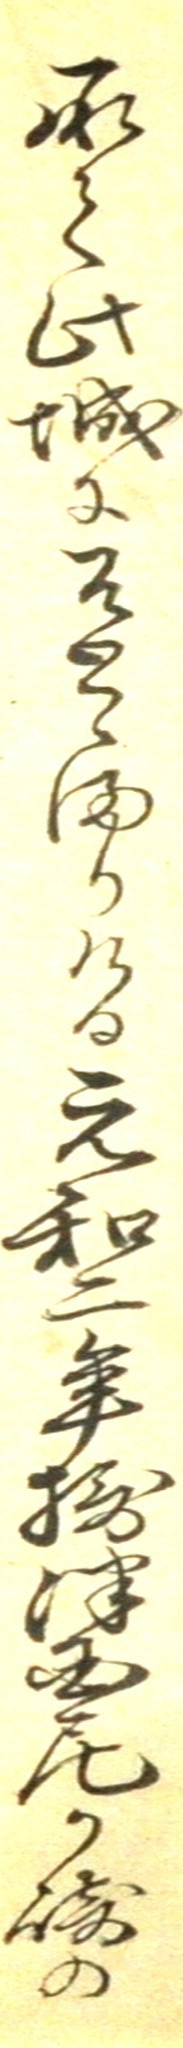承て此城にそとゝまりける元和二年摂津国尼か崎の
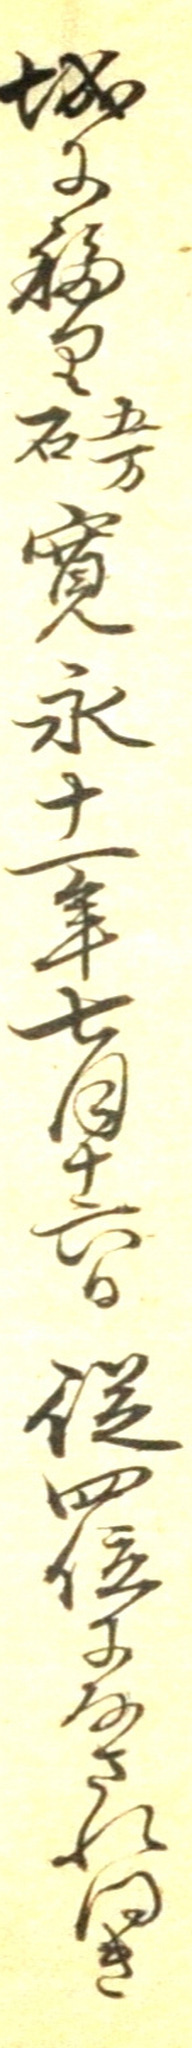城に移り五万石寛永十一年七月十六日従四位になされ同き
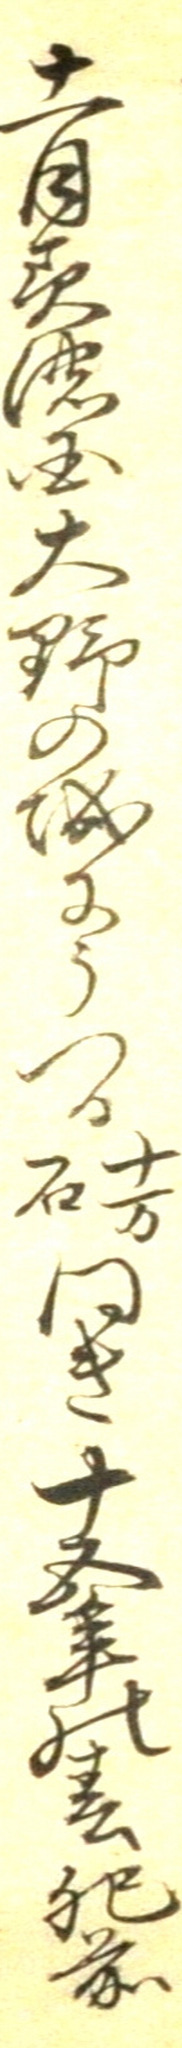十一月美濃国大野の城にうつる十万石同き十五年の春肥前
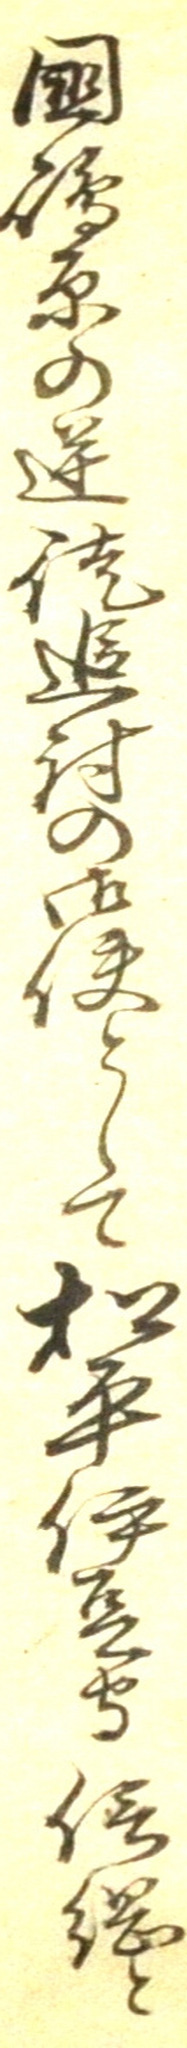国島原の逆徒追討の御使として松平伊豆守信綱と
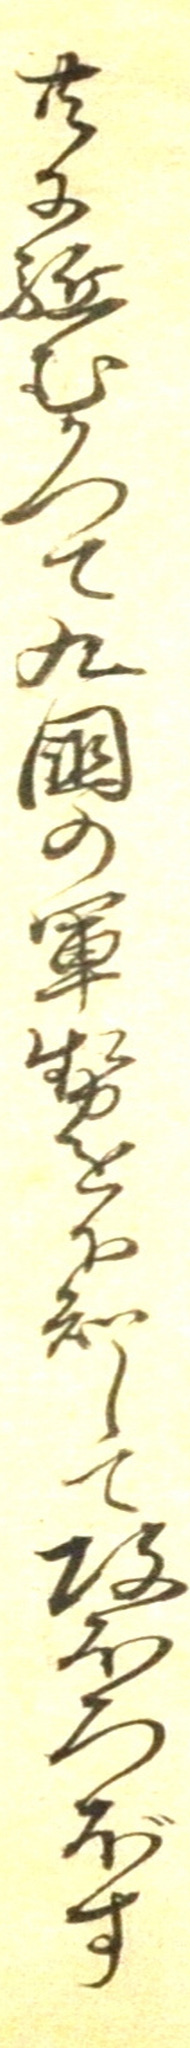共に駈むかつて九国の軍勢を下知して攻ほろぼす
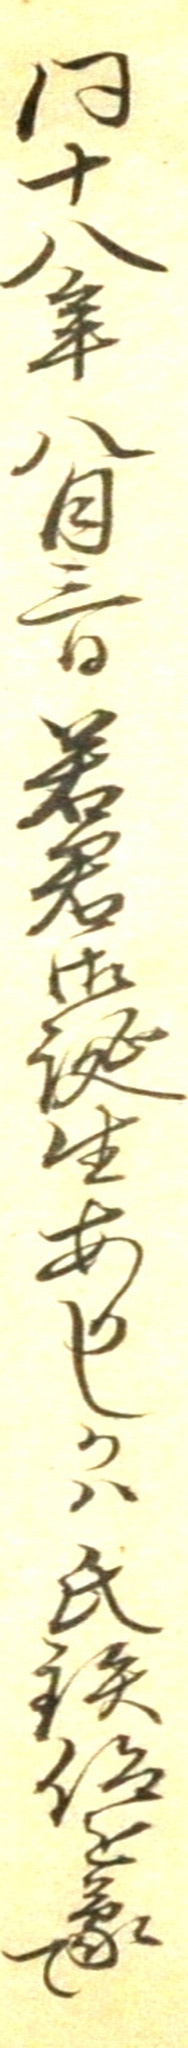同十八年八月三日若君御誕生ありしかは氏鉄仰を蒙て
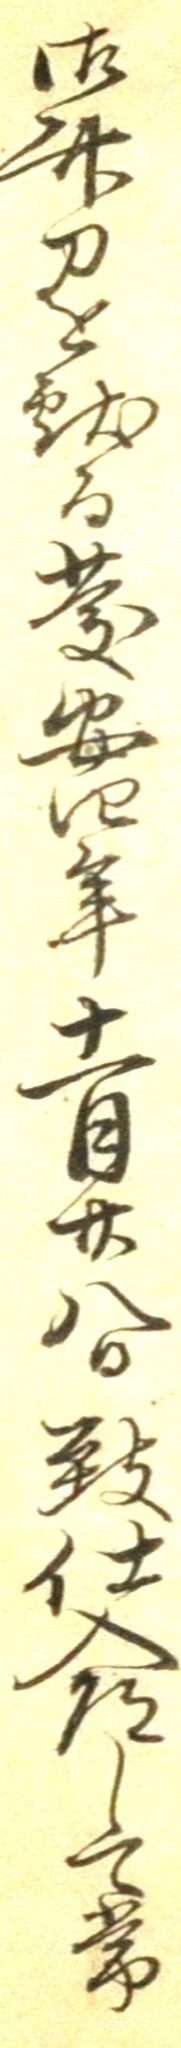御竹刀を献る慶安四年十一月廿八日致仕入道して常
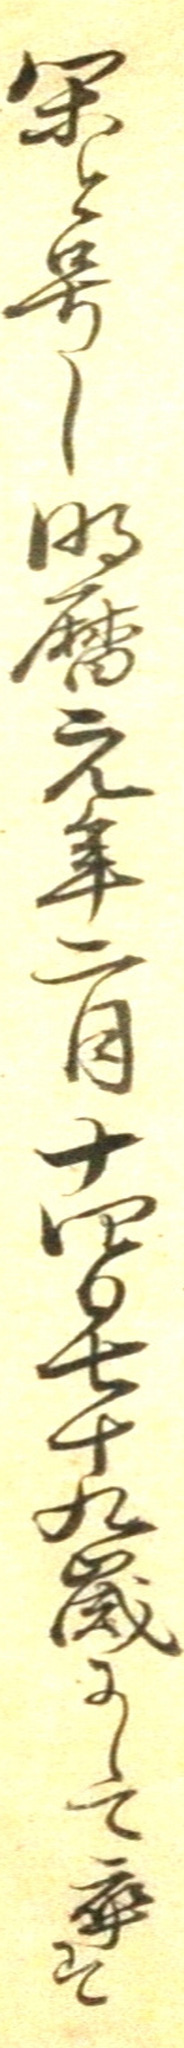閑と号し明暦元年二月十四日七十九歳にして卒す
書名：藩翰譜（四・下）
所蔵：伊那市立高遠町図書館・合同会社AMANE
